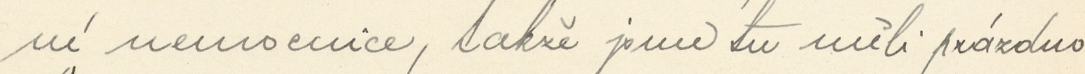ní nemocnice, takže jsme tu měli prázdno.
